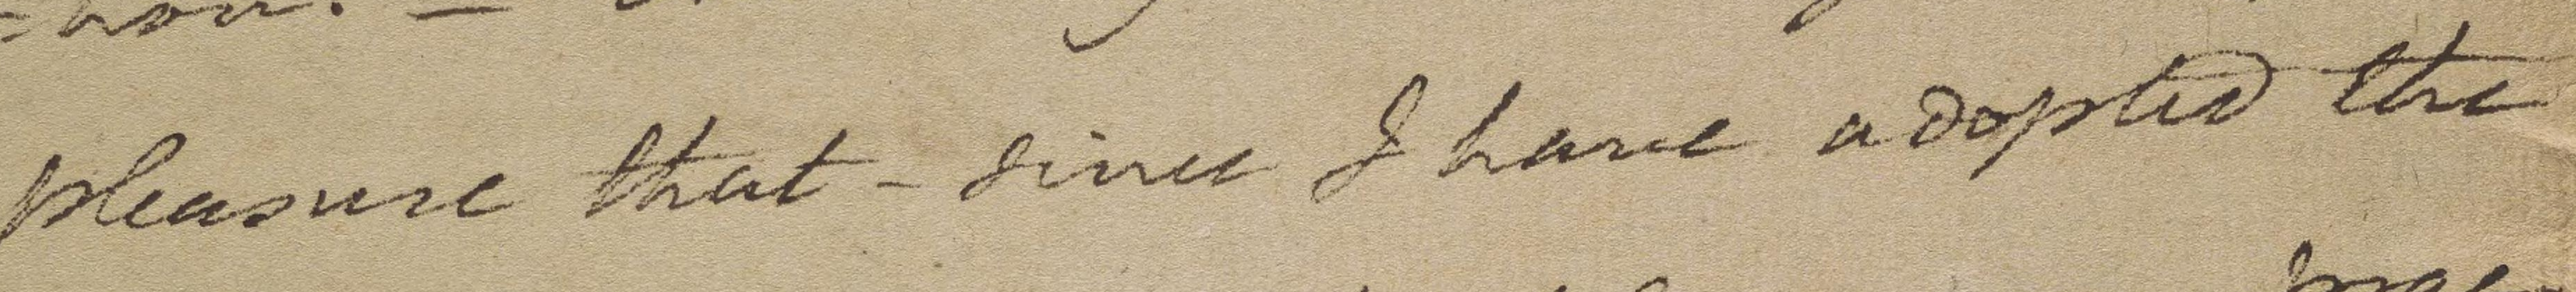pleasure that- since I have adopted the
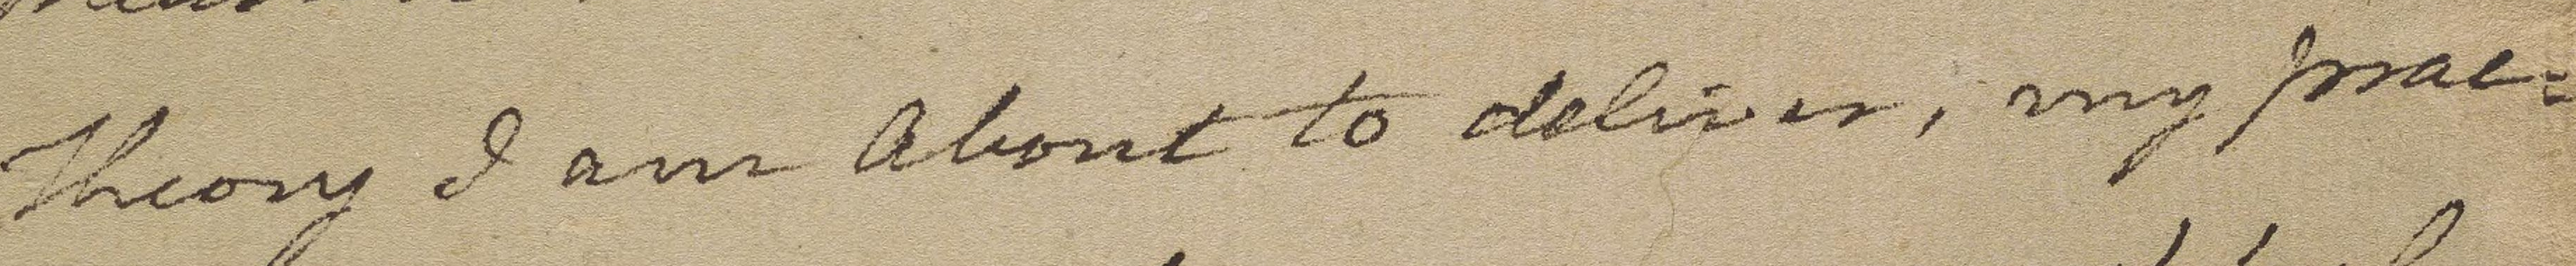Theory I am about to deliver, my prac-
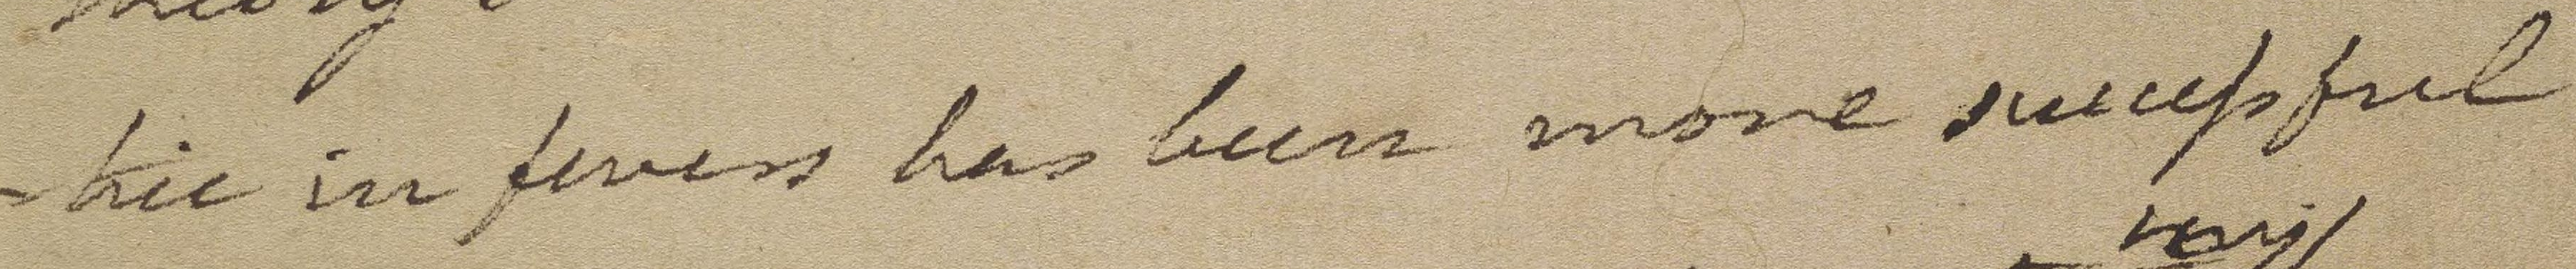-tic in fevers has been more successful
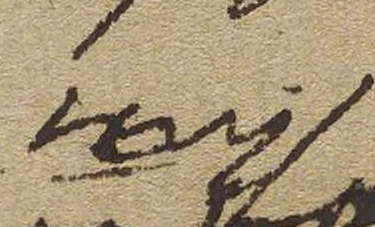my
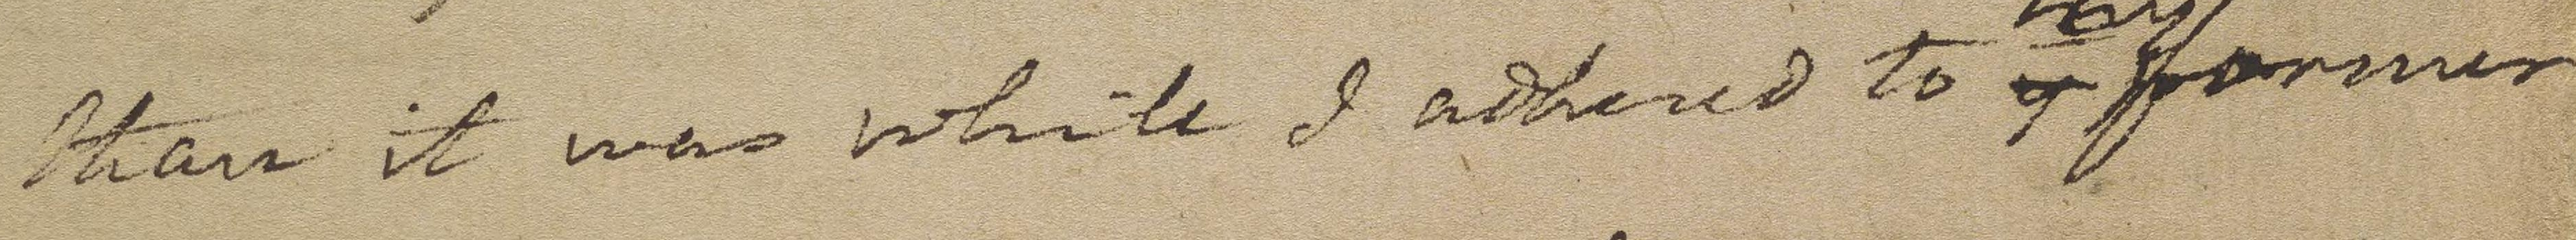than it was while I adhered to [y] former
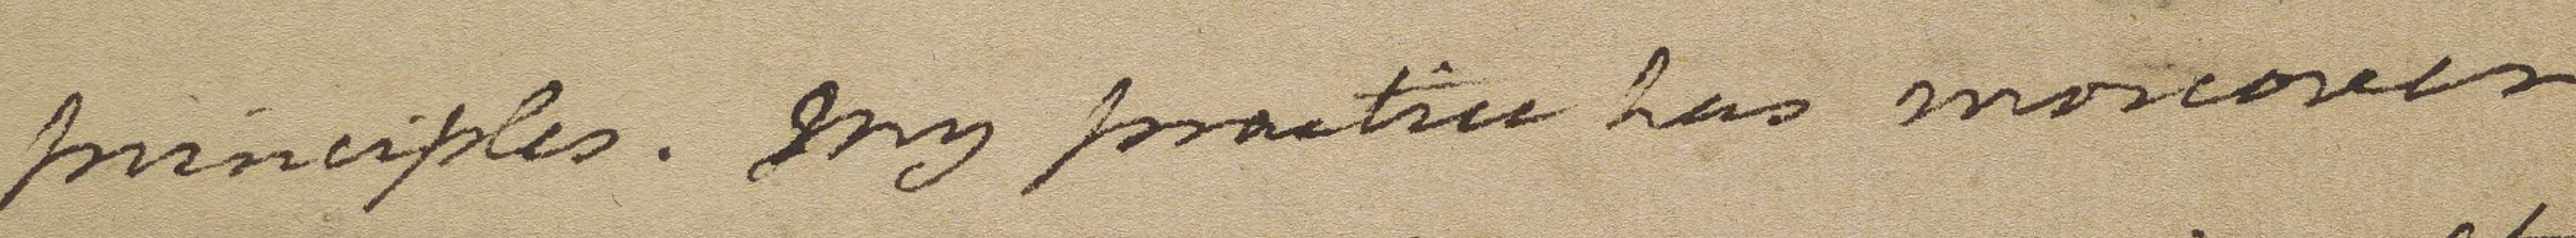principles. My practice has moreover
